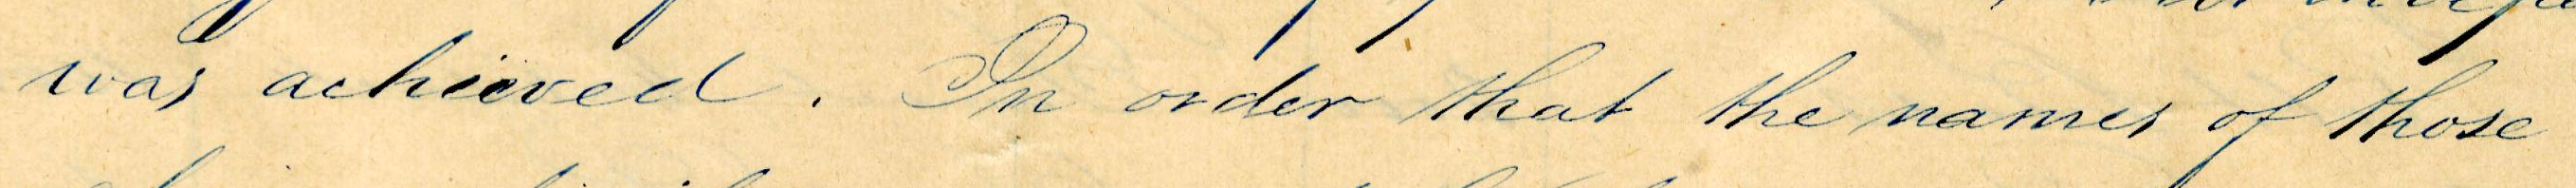was achieved. In order that the names of those
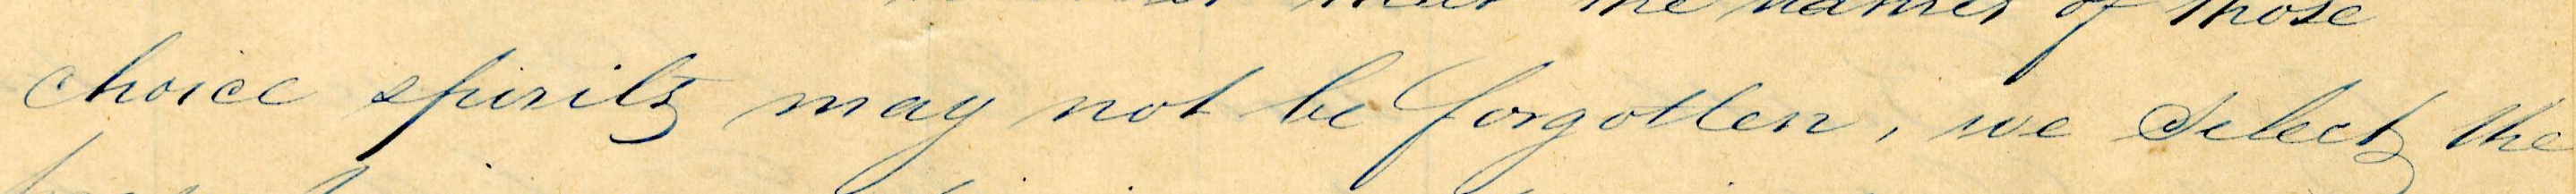choice spirits may not be forgotten, we select the
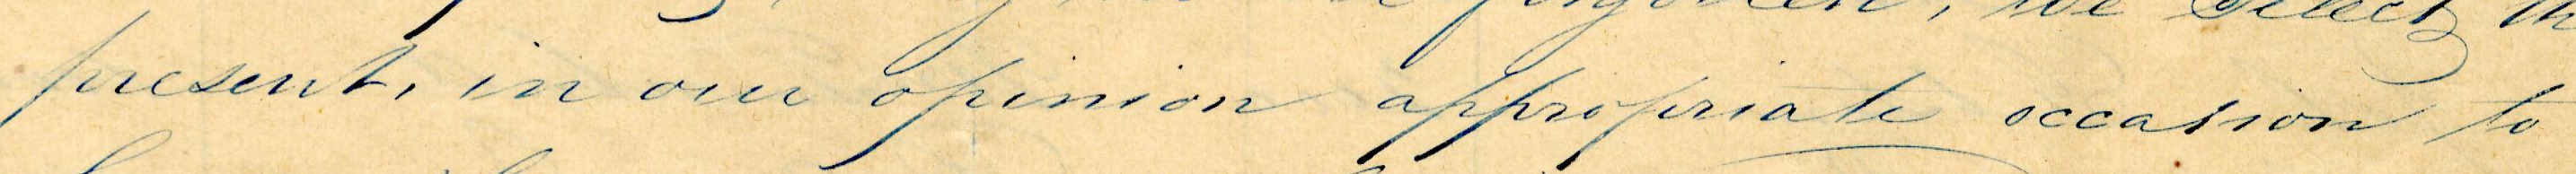present, in our opinion appropriate occasion to
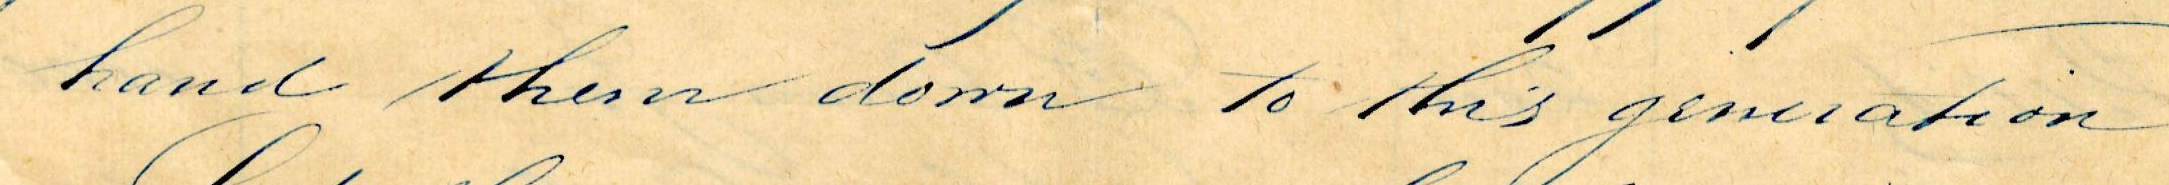hand then down to this generation
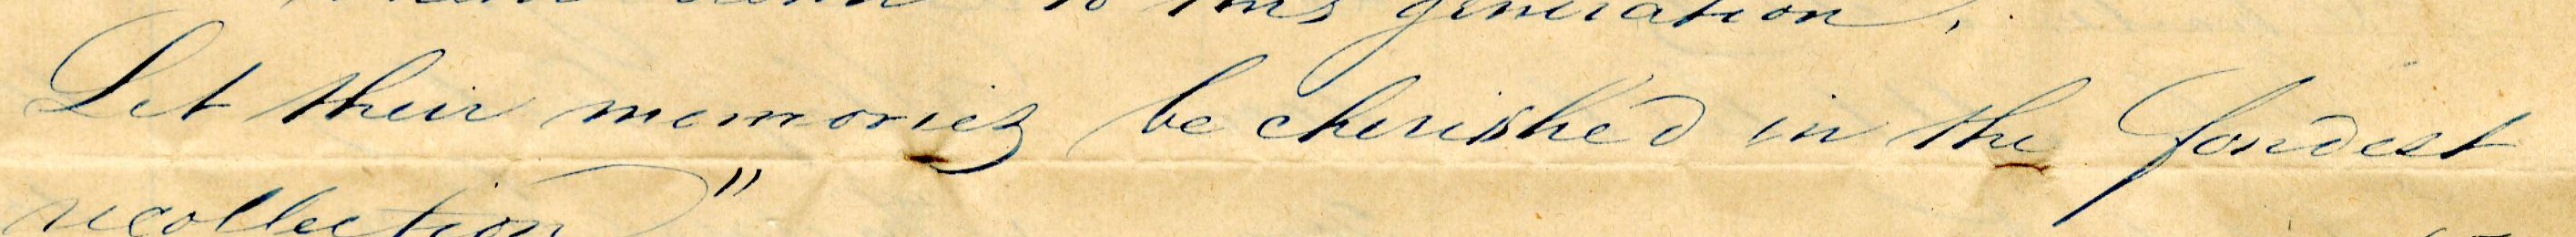Let their memories be cherished in the fondest
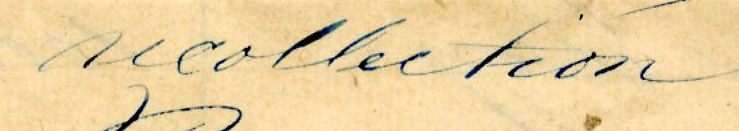recollection
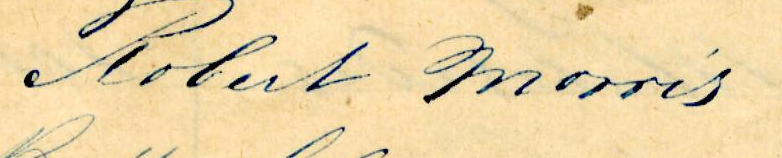Robert Morris
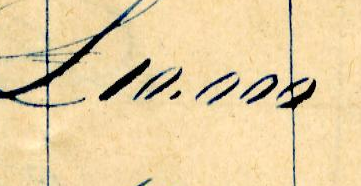£10.000
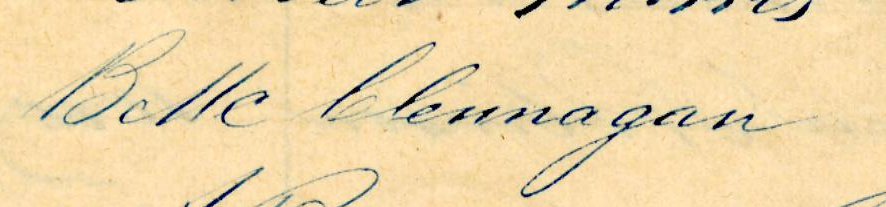Belle Clennagan
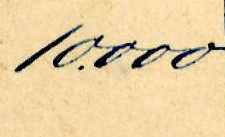10.000
